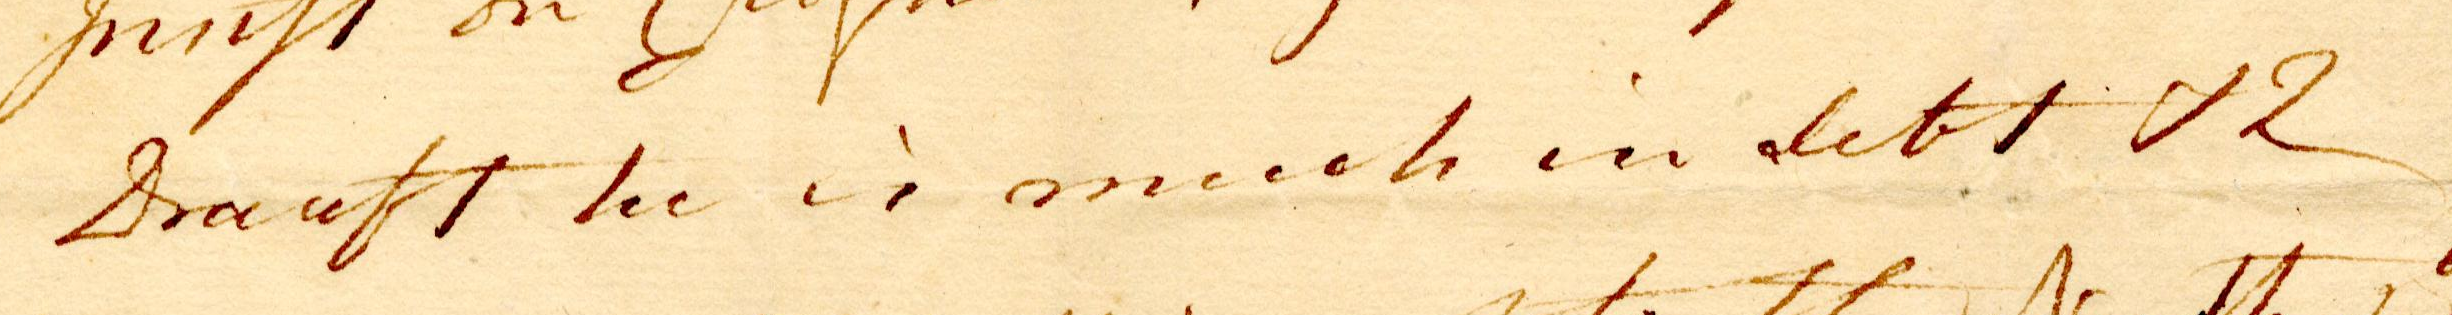Drauft he is much in debt & 1
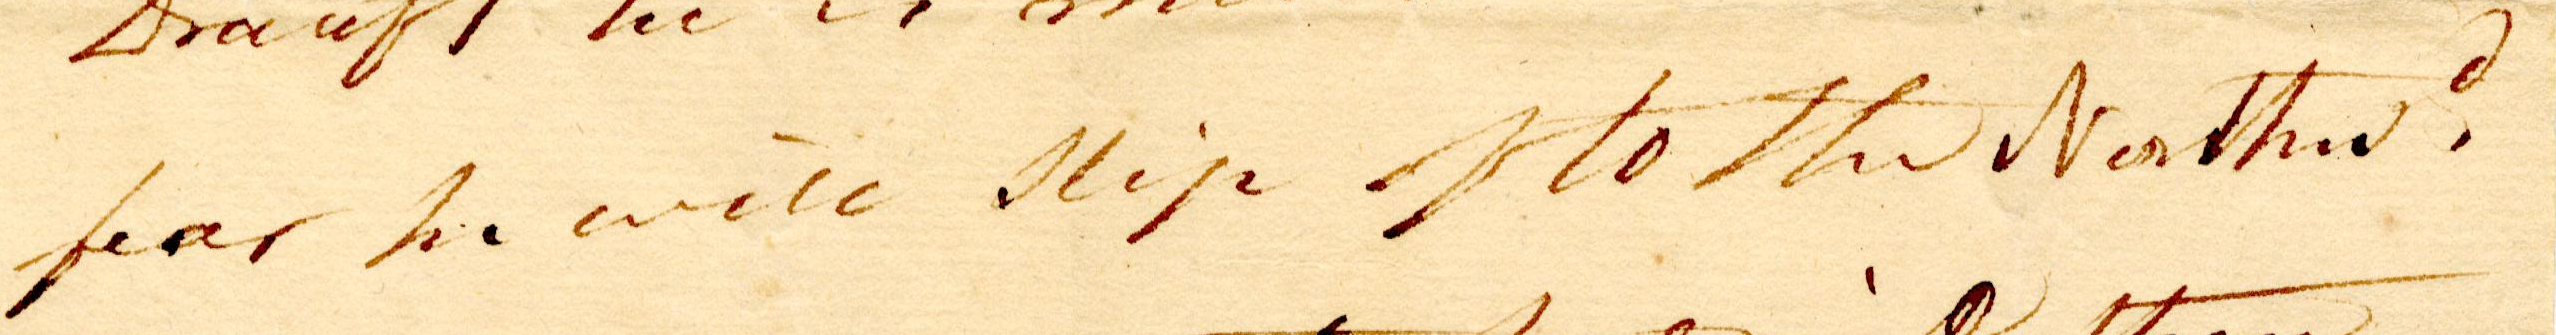fear he will ship of to the Northw^d.
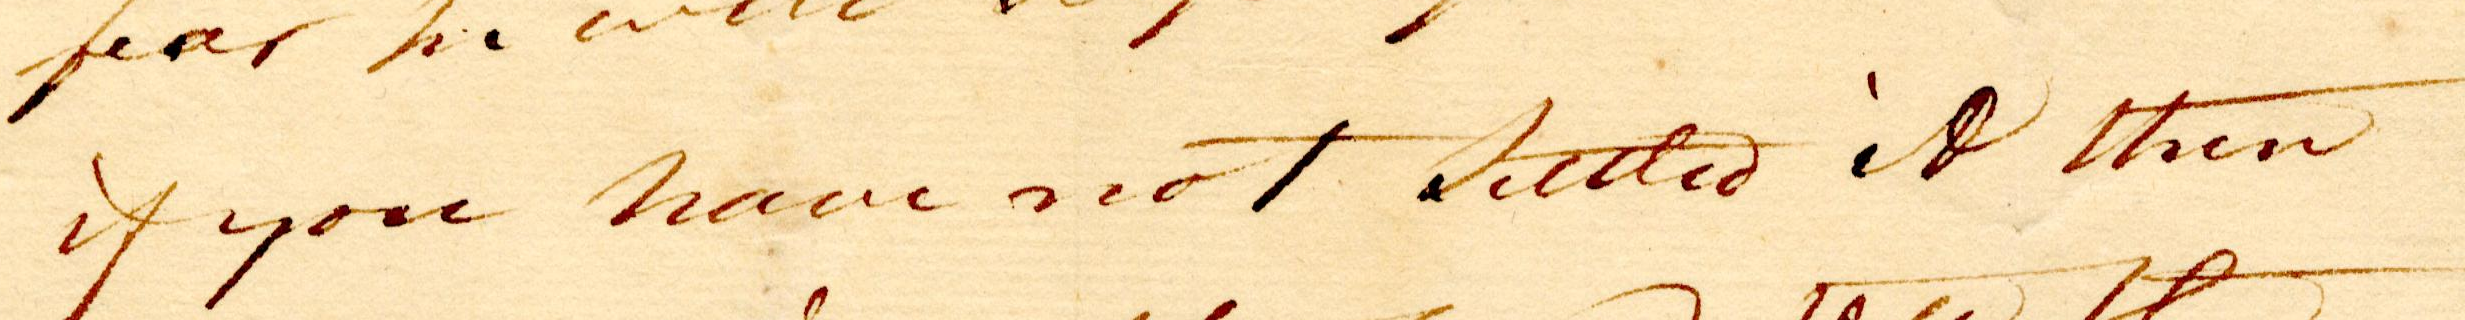if you have not setled it then
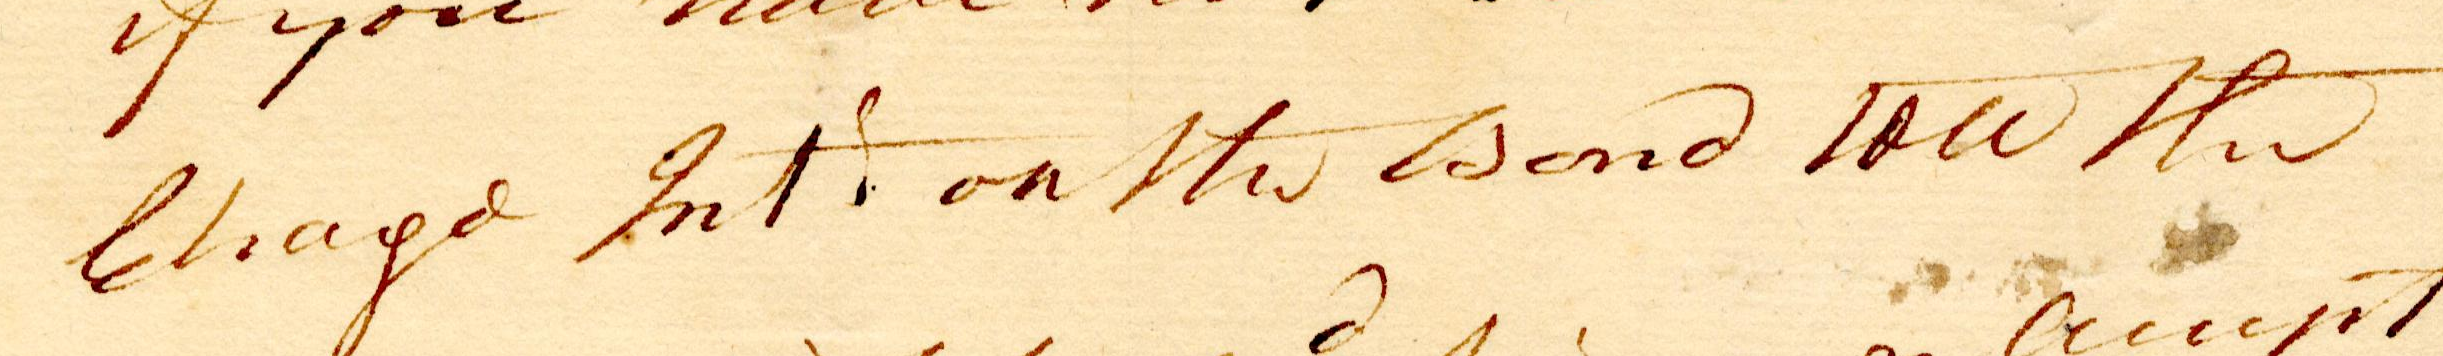chargd Int^s on the Bond tow the
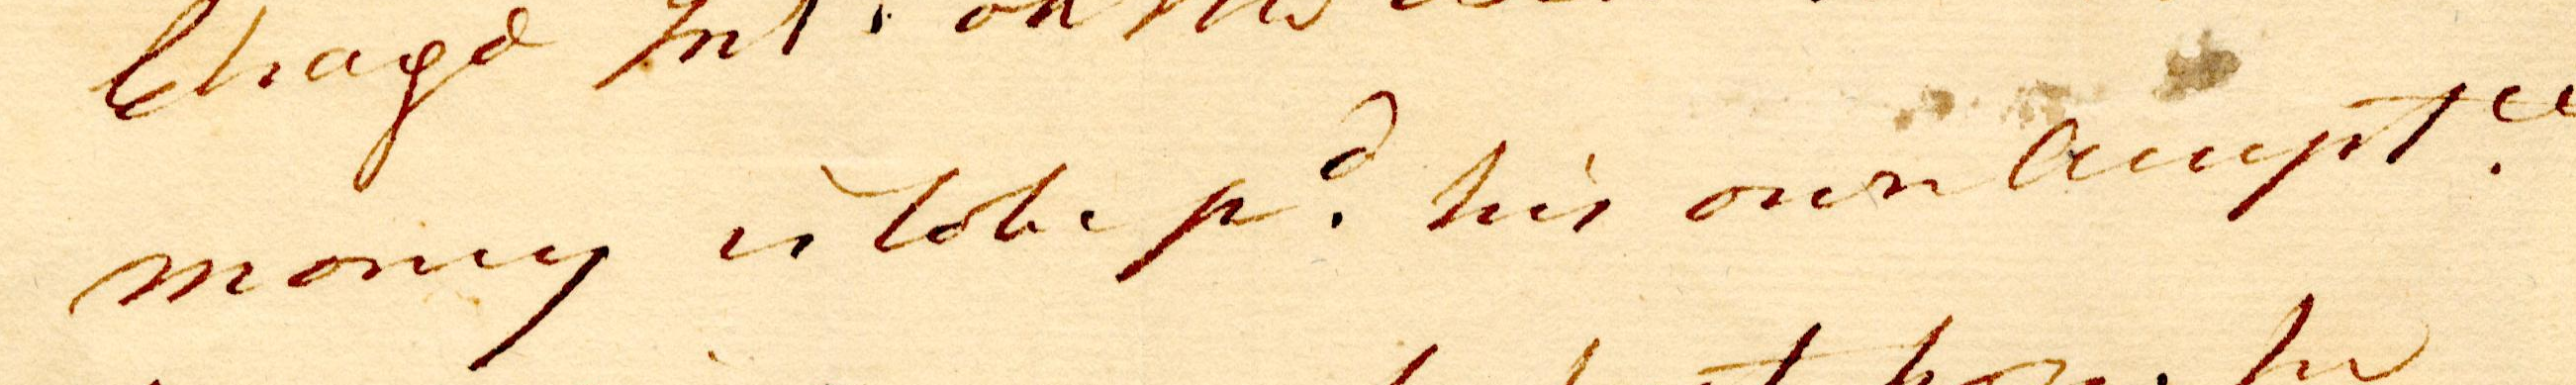money is to be p^d. his own Accept^ce
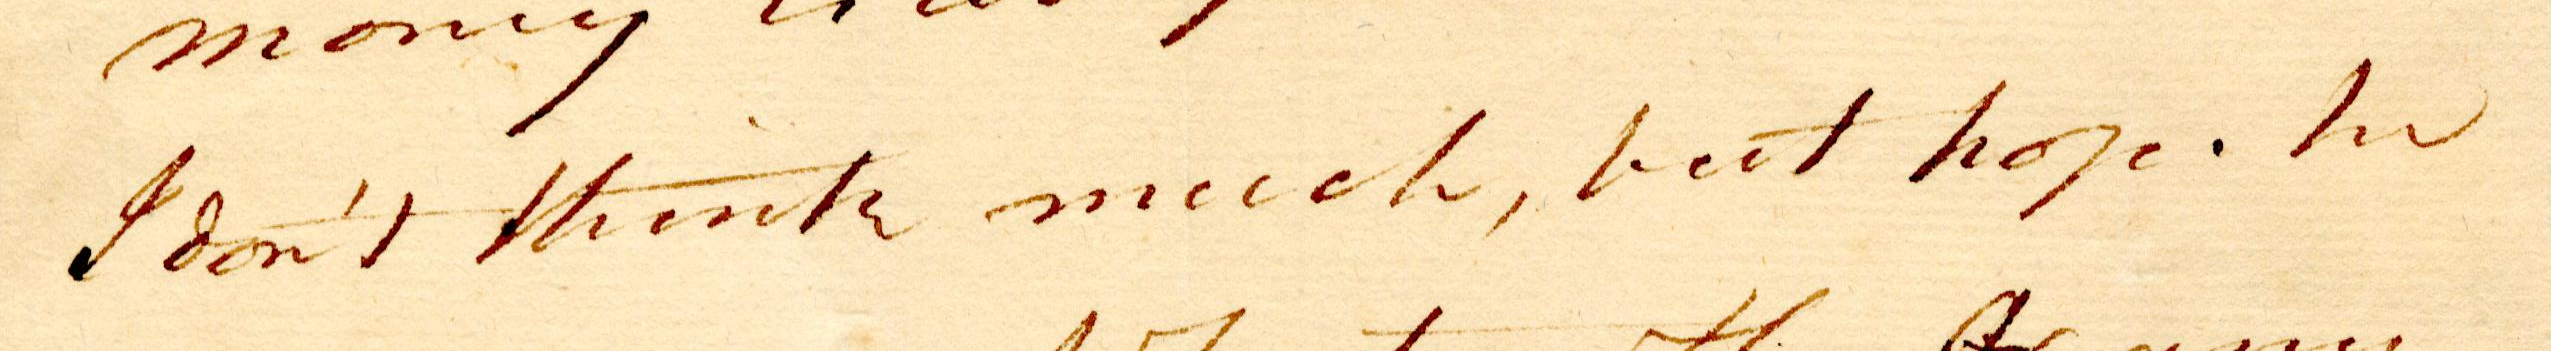I don't think much, but hope he
